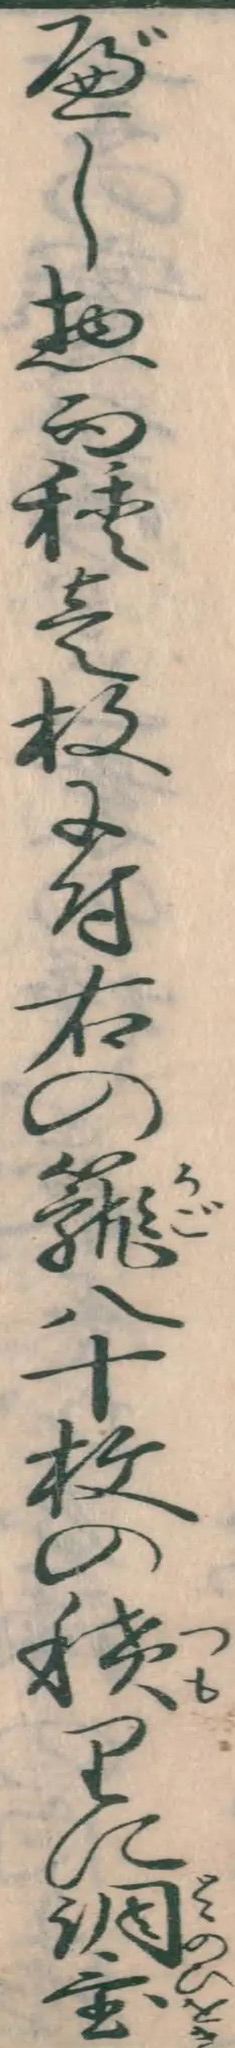べし惣而種壱枚に付右の籠八十枚の積りに調置
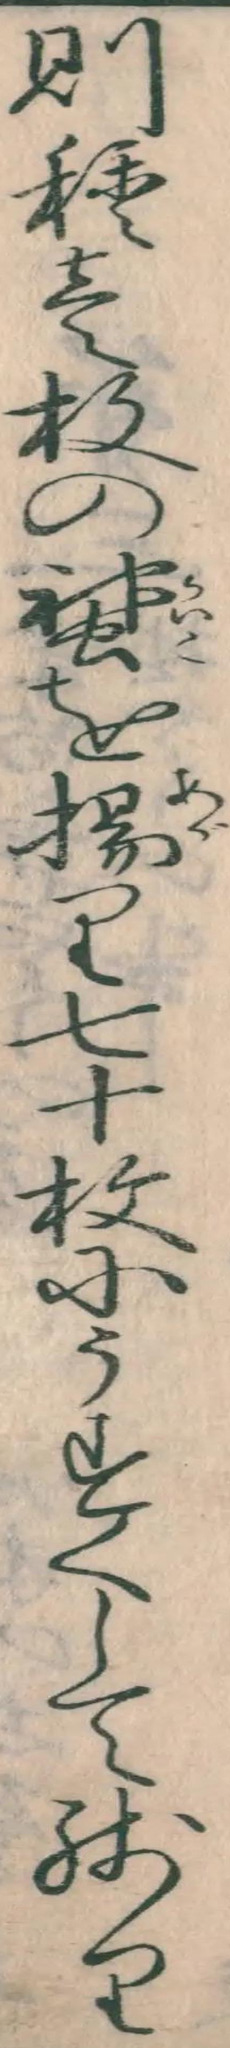則種壱枚の䗝を揚り七十枚にうすくして残り
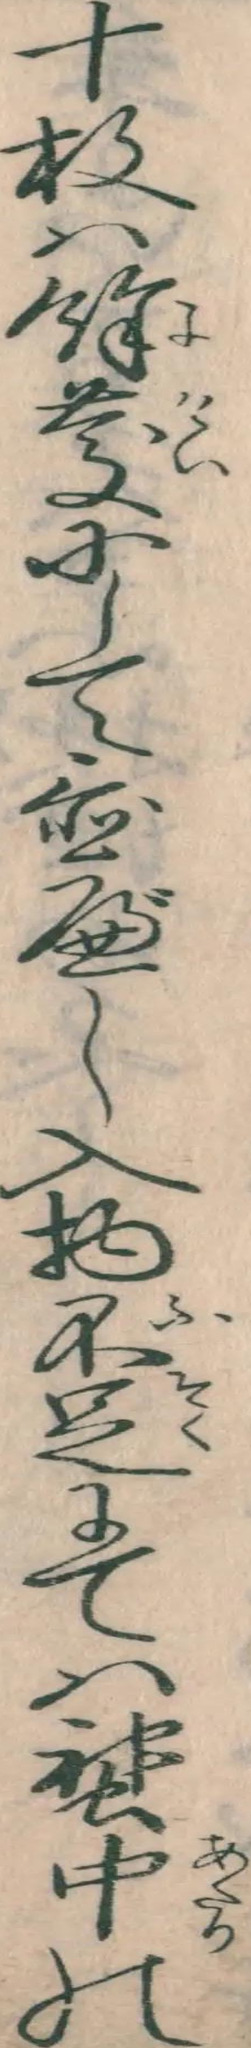十枚は余慶にして置べし入物不足にては䗝中の

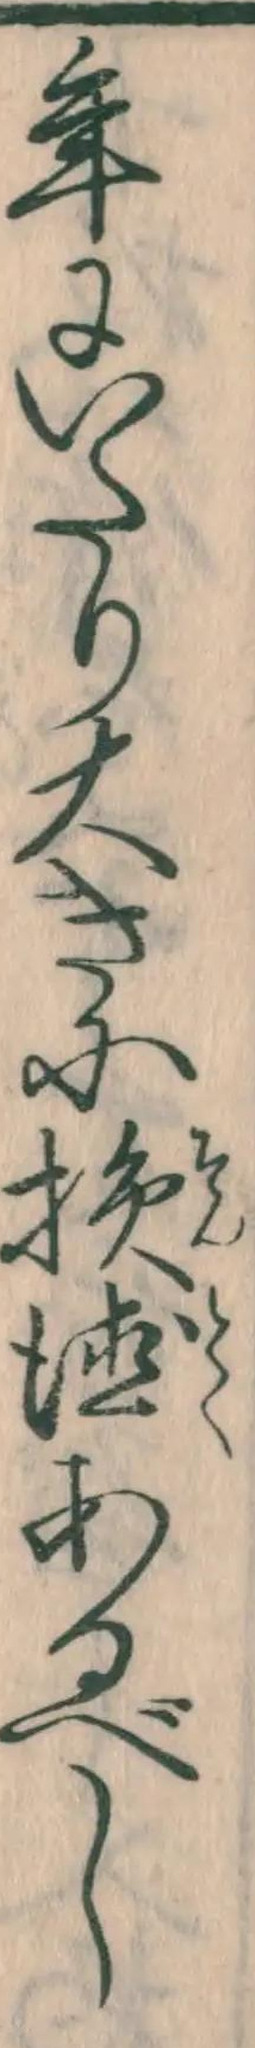年にいたり大きに損徳あるべし
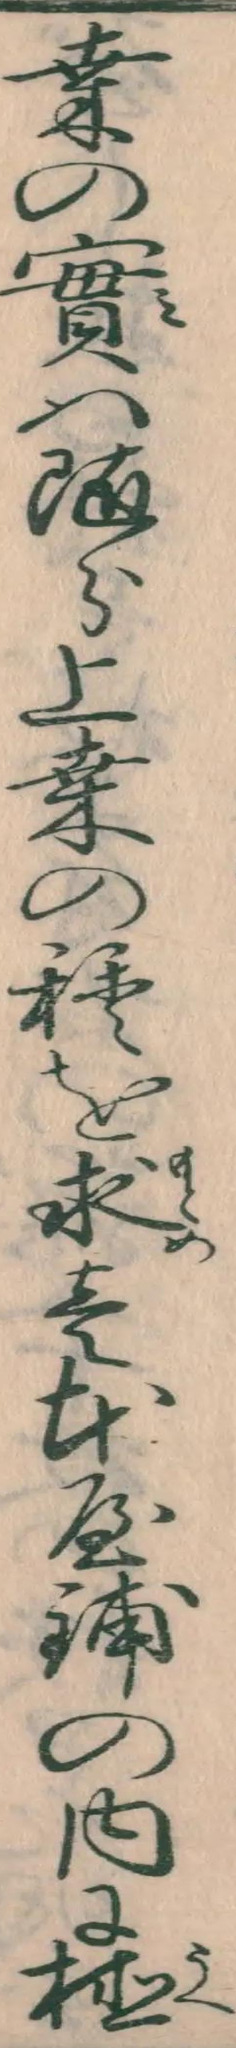桑の実は随分上桑の種を求壱本屋舗の内に植
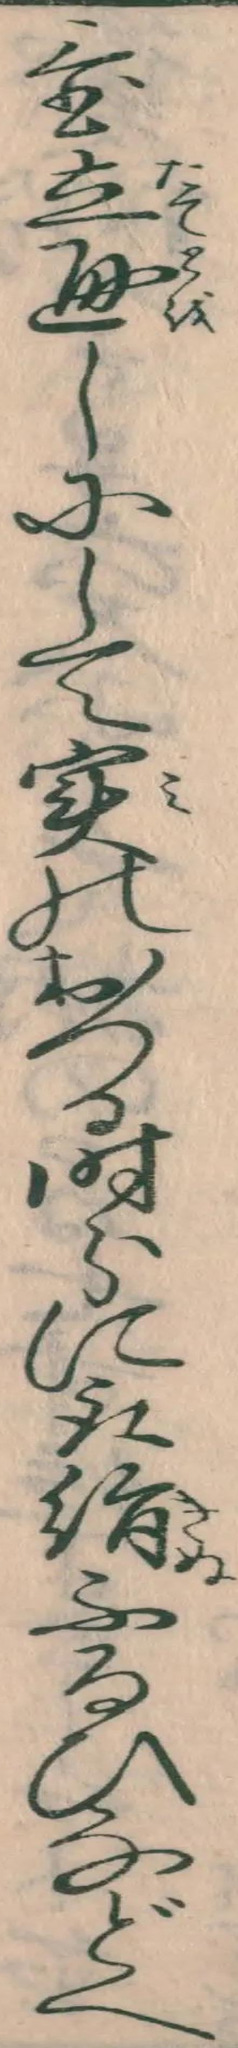置立通しにして実のおつる時分に取絹ふるひなどへ
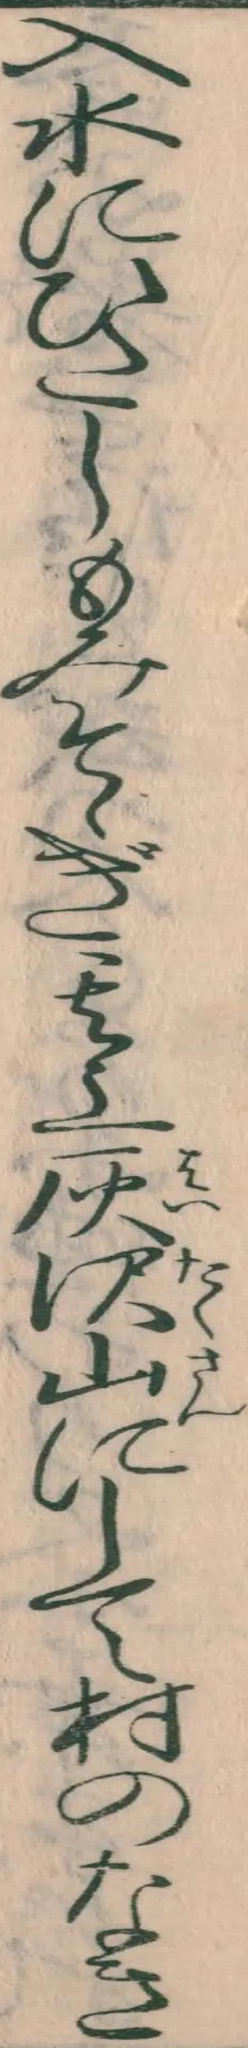入水にひたしもみそゝぎ其上灰沢山にして村のなき
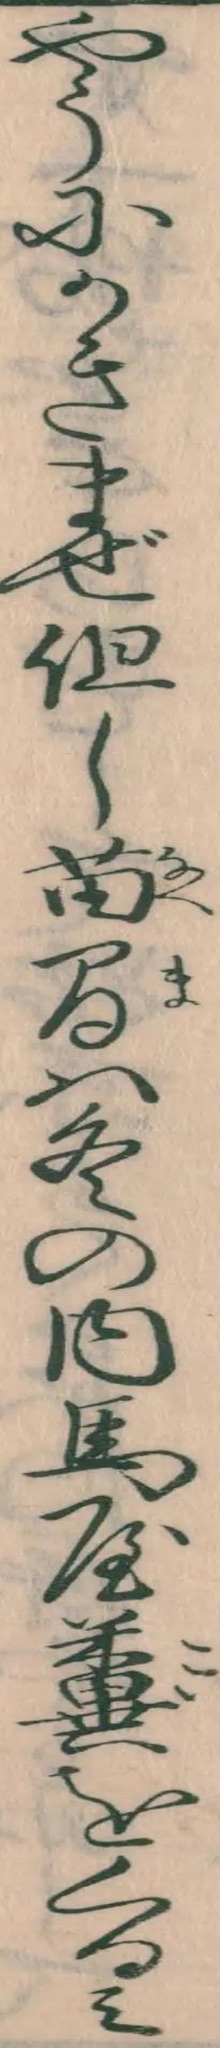やうにかきまぜ但し苗間は冬の内馬屋糞をくるみ
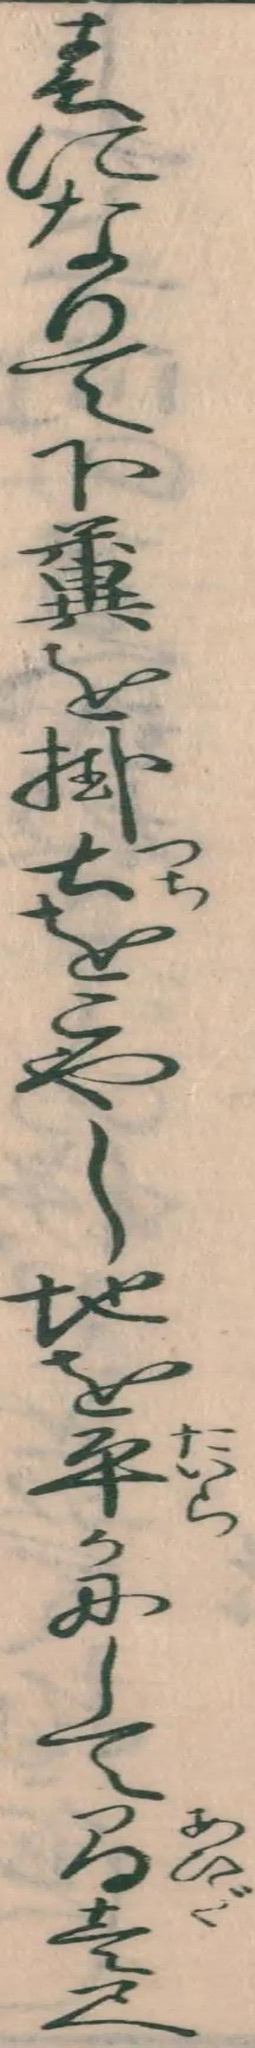春になりて下糞を掛土をこやし地を平かにして間壱尺
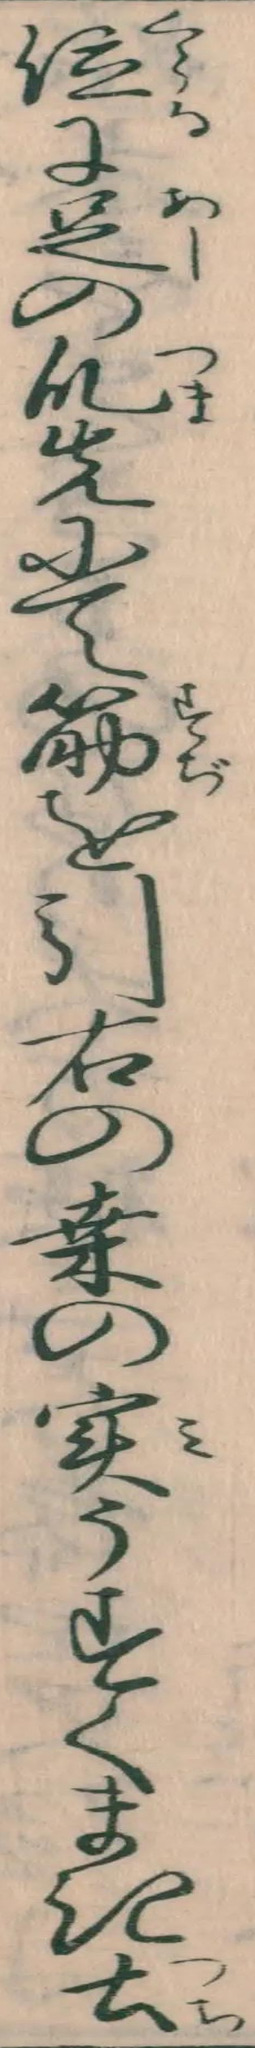位に足の爪先にて筋を引右の桑の実うすくまき土
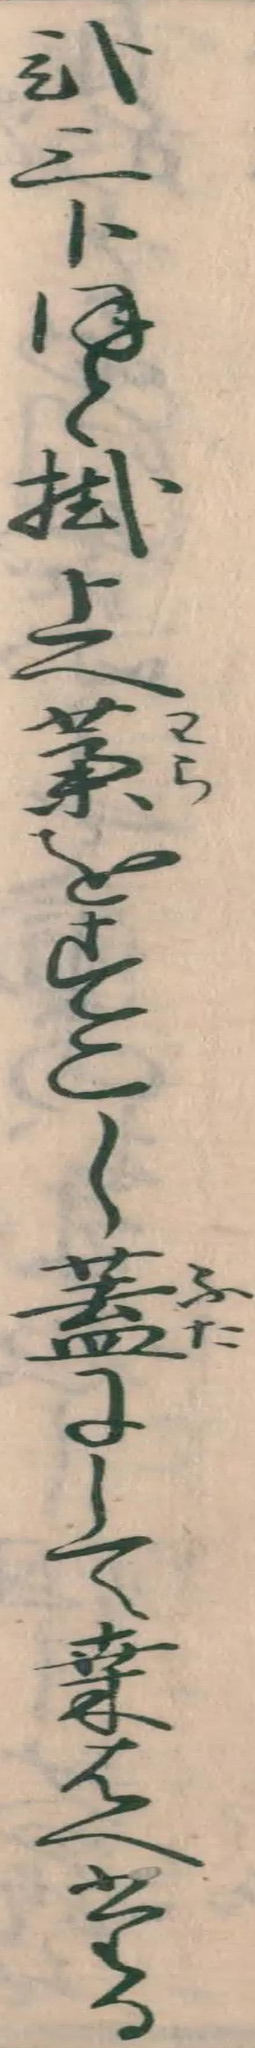弐三分ほと掛上へ藁をすこし蓋にして桑はへたる
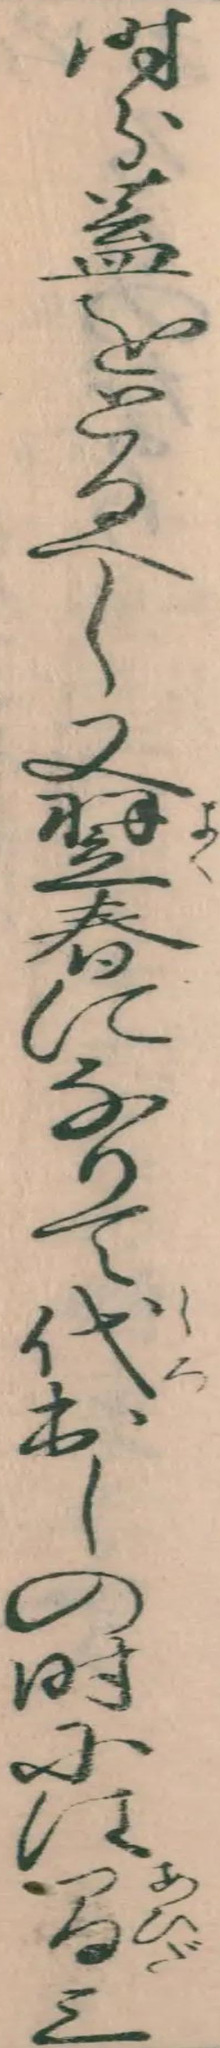時分蓋をとるへし又翌春になりて代出しの時には間三
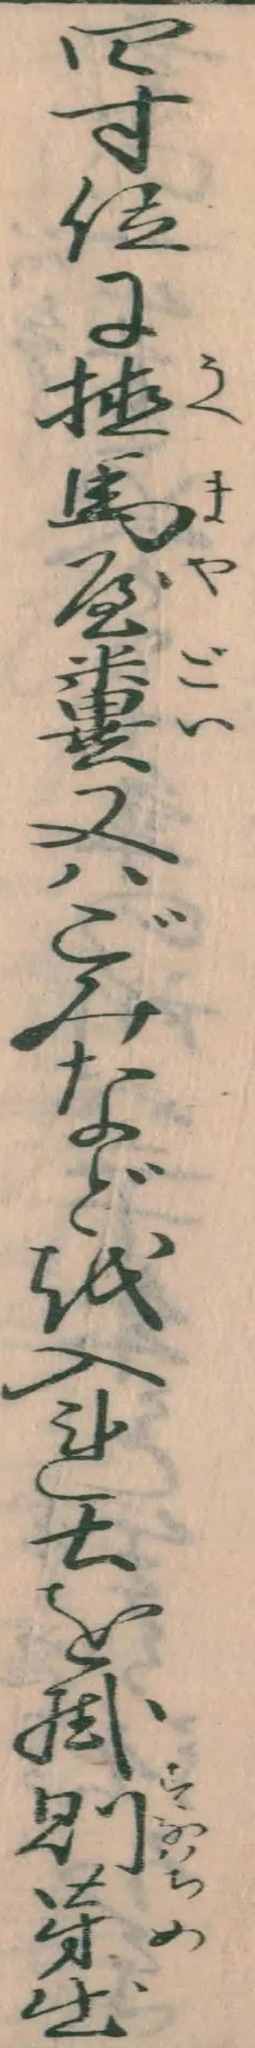四寸位に植馬屋糞又はごみなどを入れ土を掛則芽出
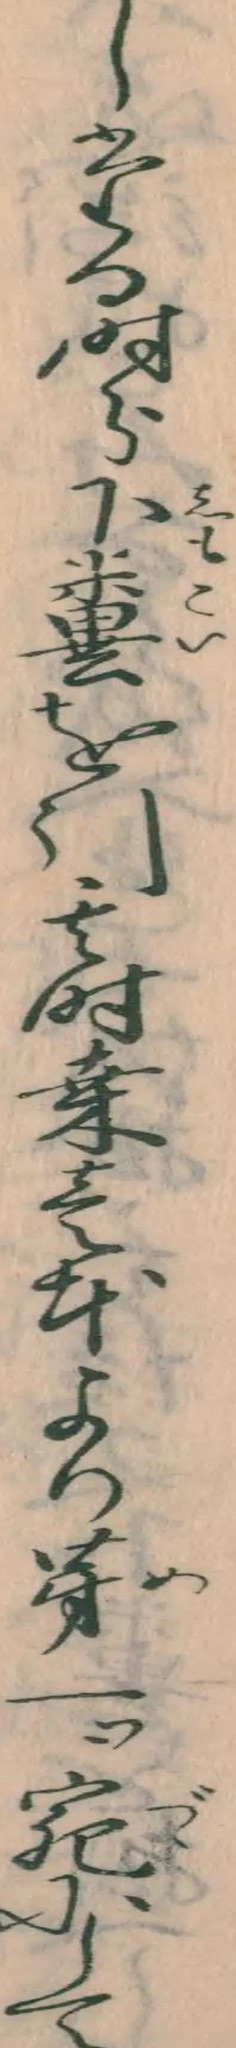したる時分下糞を引其時桑壱本より芽一ッ宛にして
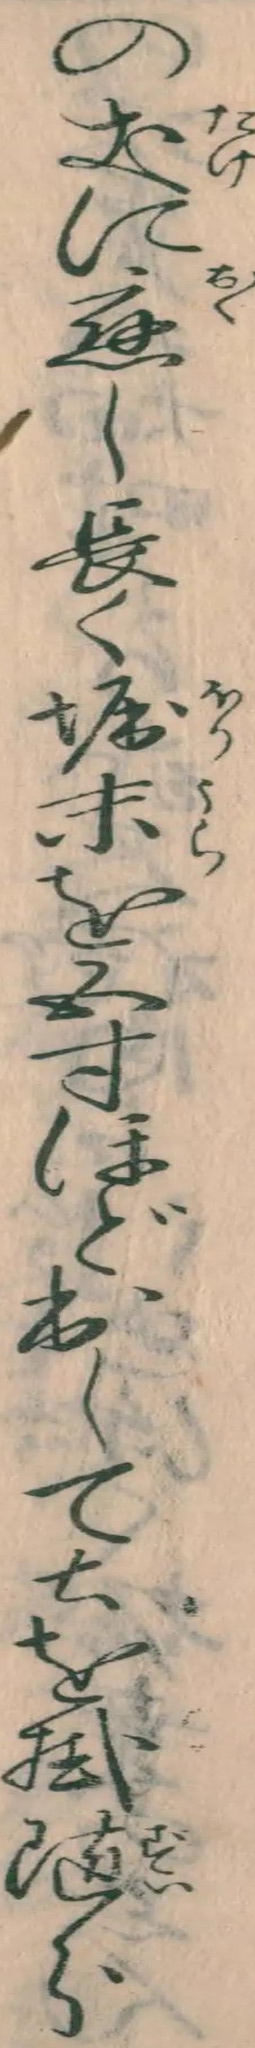の丈に応し長く堀末を五寸ほど出して土を掛随分
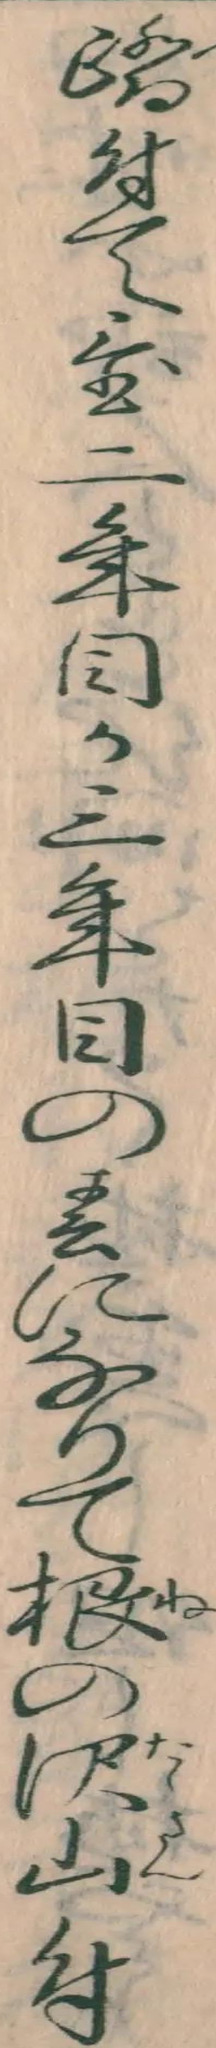踏付て置二年目か三年目の春になりて根の沢山付
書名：新撰養蚕秘書
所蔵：国立国会図書館 National Diet Library, JAPAN
